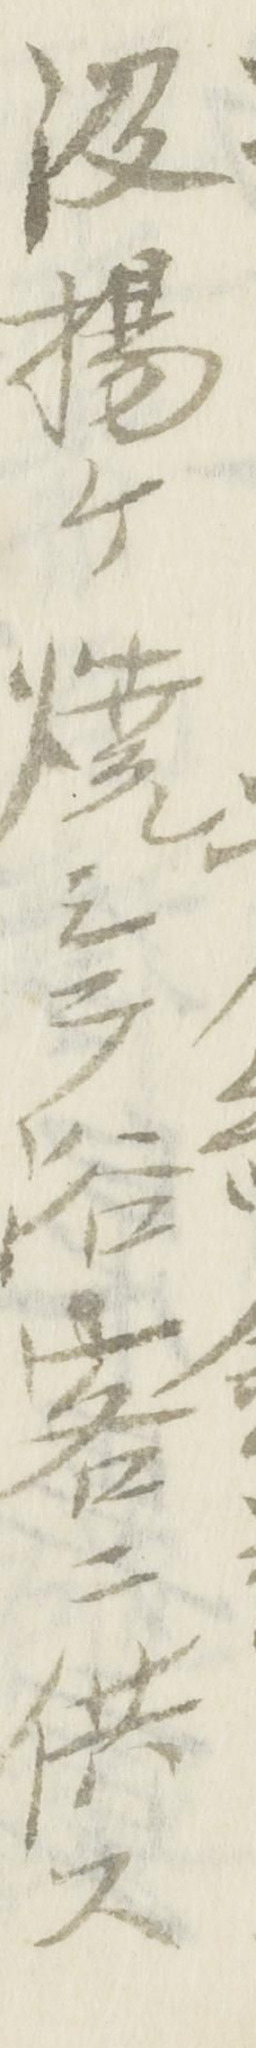汲揚ケ焼シテ浴客ニ供ス
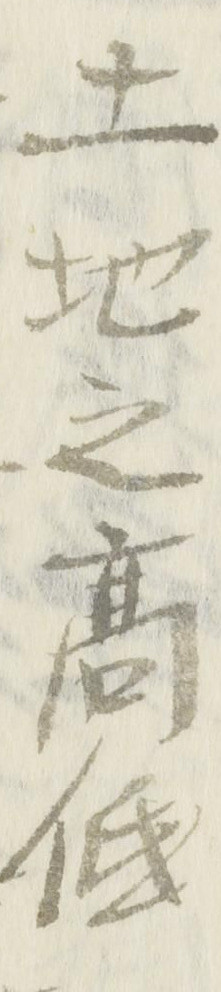土地之高低
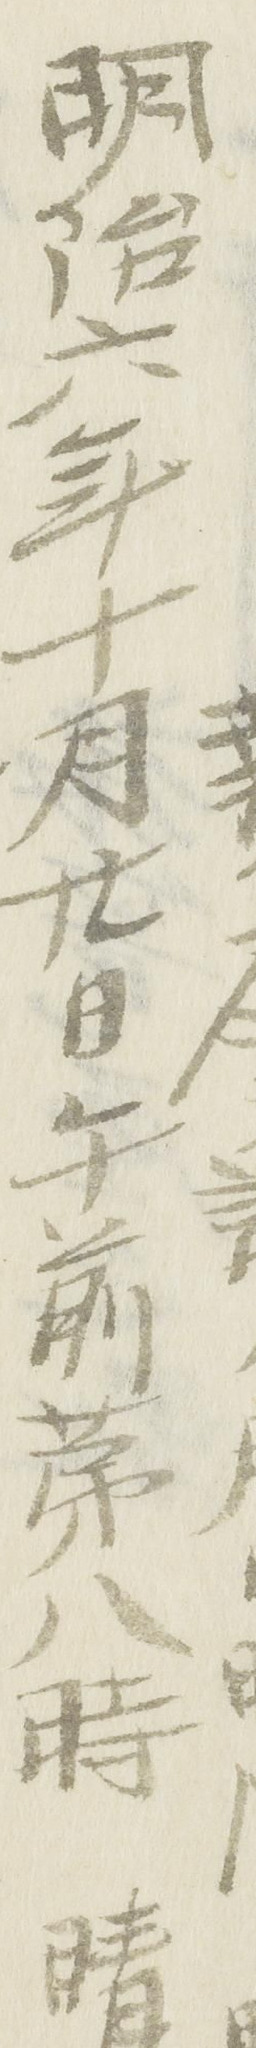明治六年十月廿日午前第八時晴
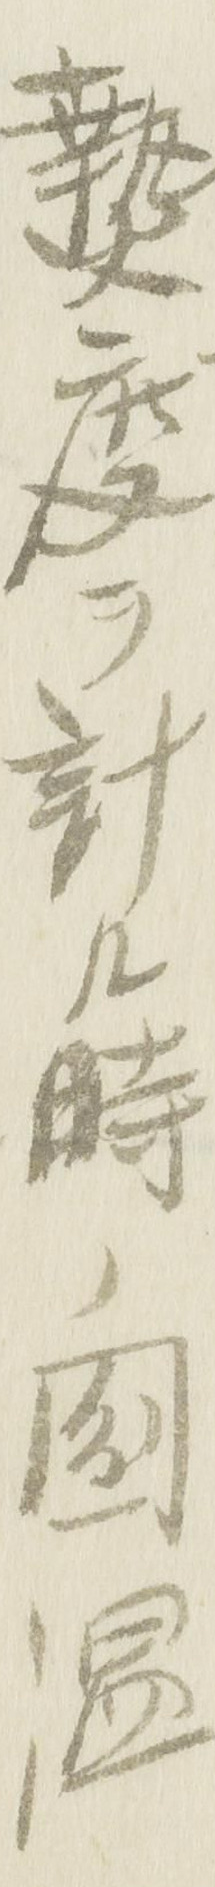熱度ヲ計ル時ノ分温
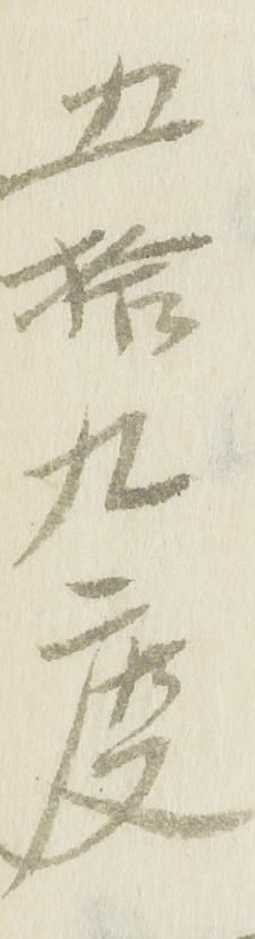五拾九度

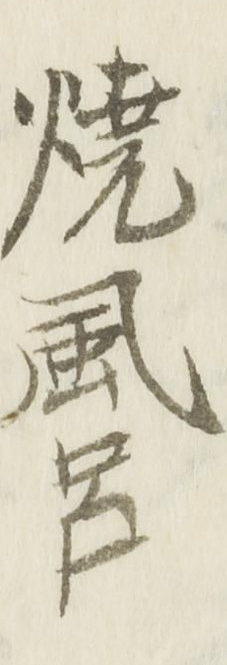焼風呂
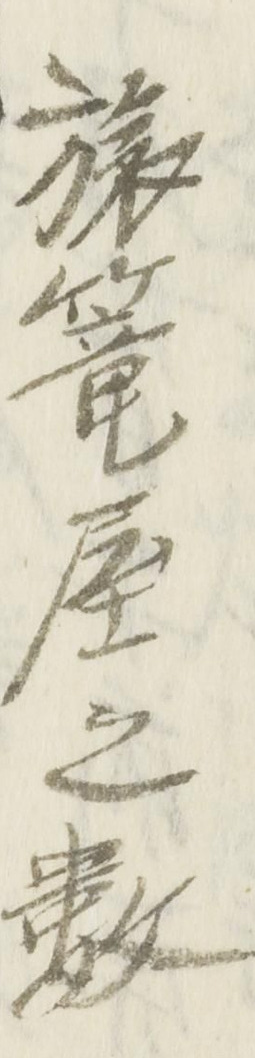旅籠屋之数
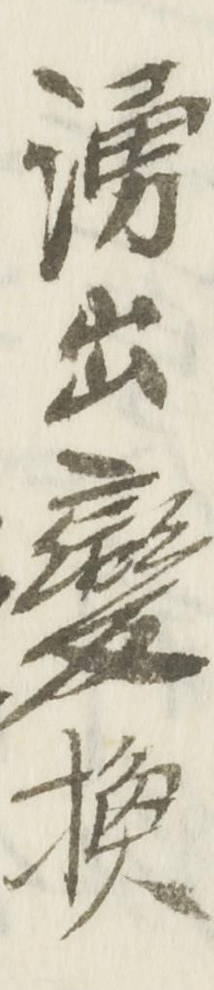湧出変換
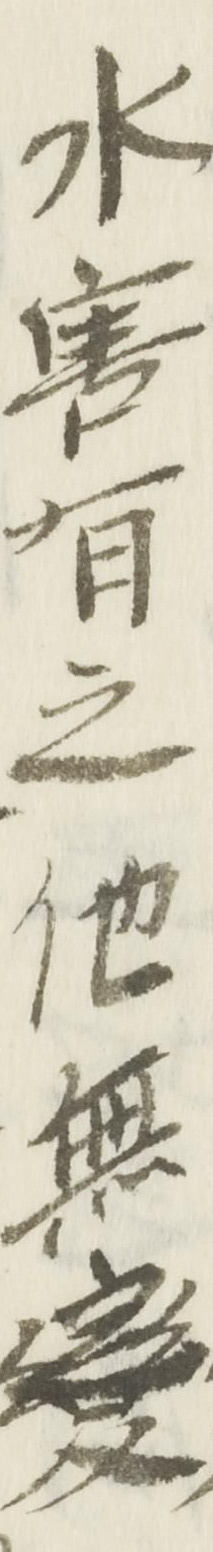水害有之他無変
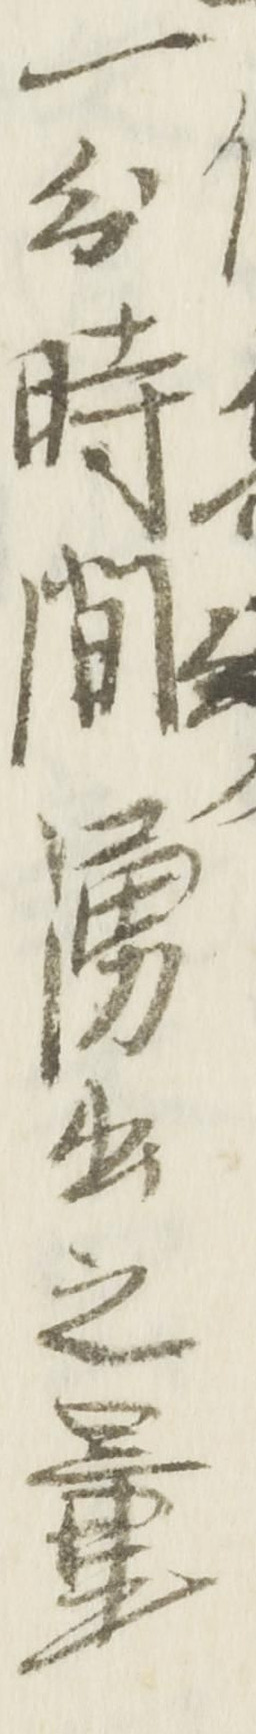一分時間湧出之量
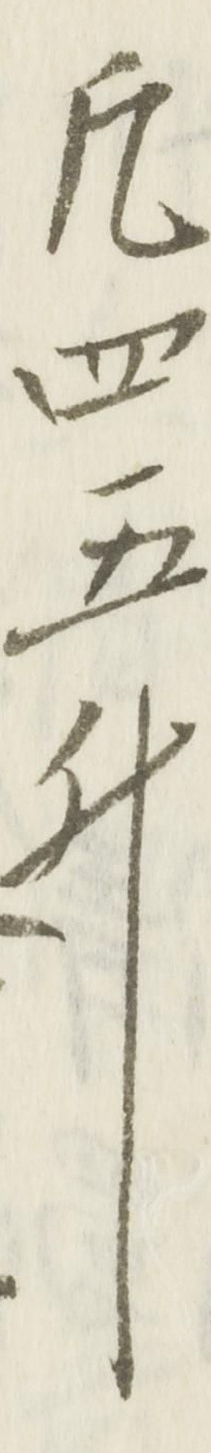凡四五升
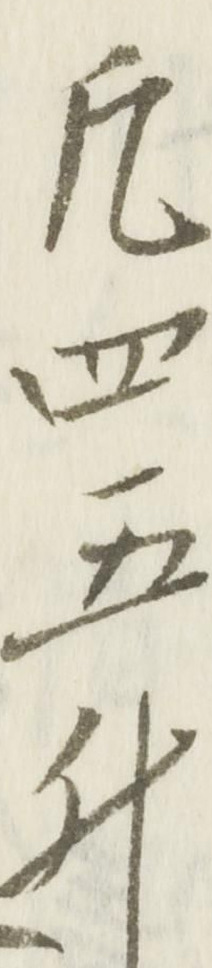凡四五升
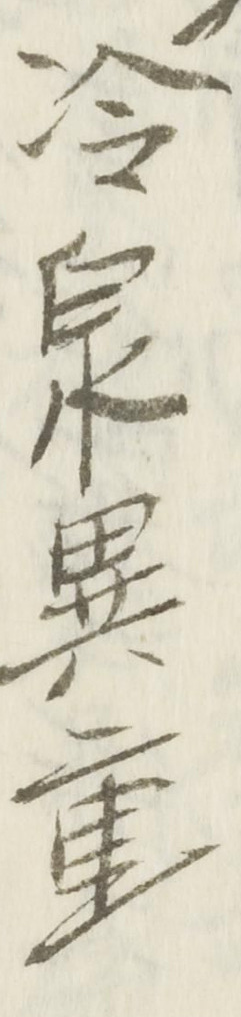冷泉異重
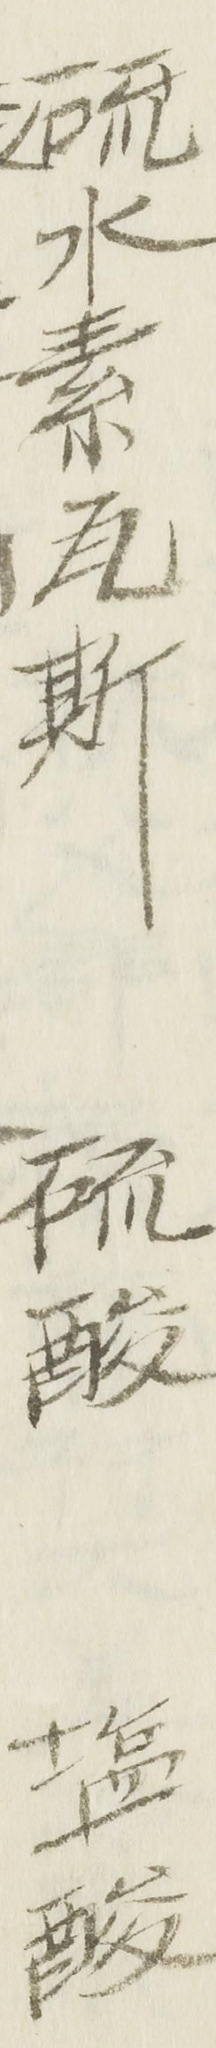硫水素瓦斯硫酸塩酸
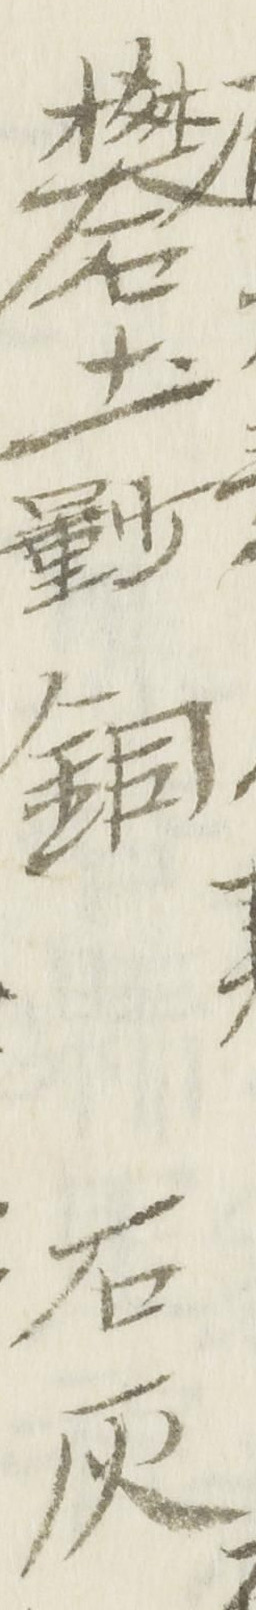礬土少量銅石灰

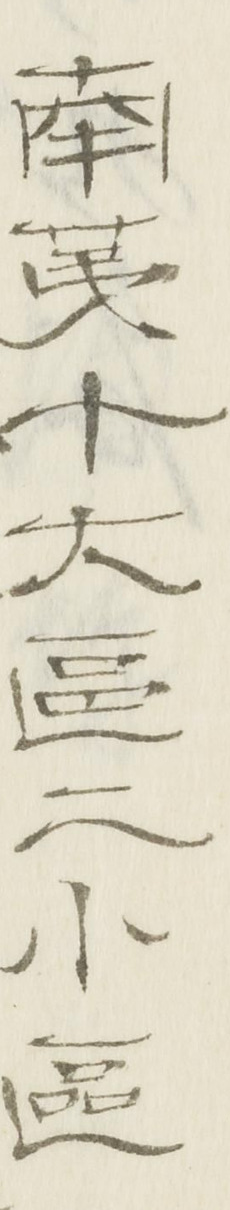南第十大区二小区
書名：温冷泉試験表
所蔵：東京大学地震研究所図書室 Earthquake Research Institute Library, The University of Tokyo, JAPAN
